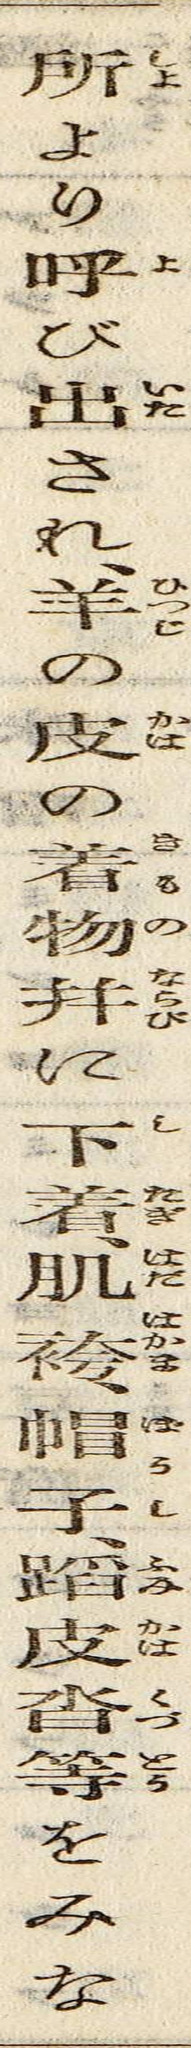所より呼び出され、羊の皮の着物并に下着、肌袴、帽子、蹈皮沓等をみな
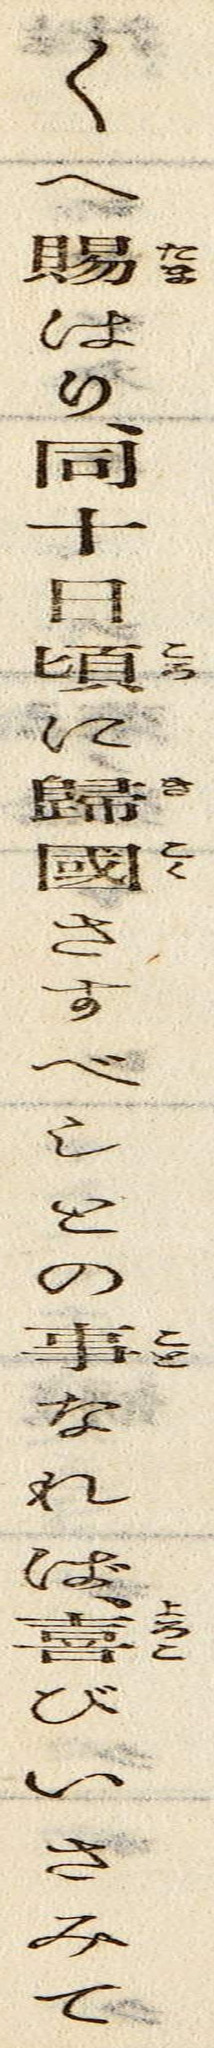〳〵へ賜はり、同十日頃に帰国さすべしとの事なれば、喜びいさみて

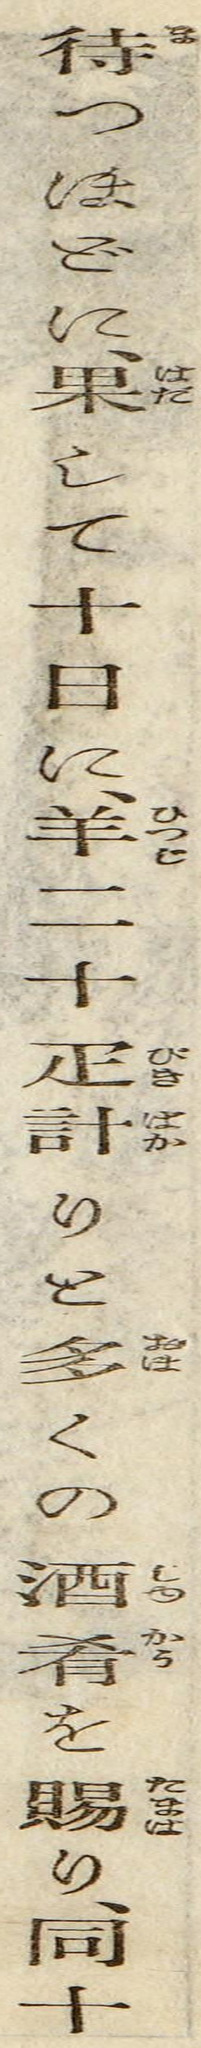待つほどに、果して十日に、羊二十疋計りと多くの酒肴を賜り、同十
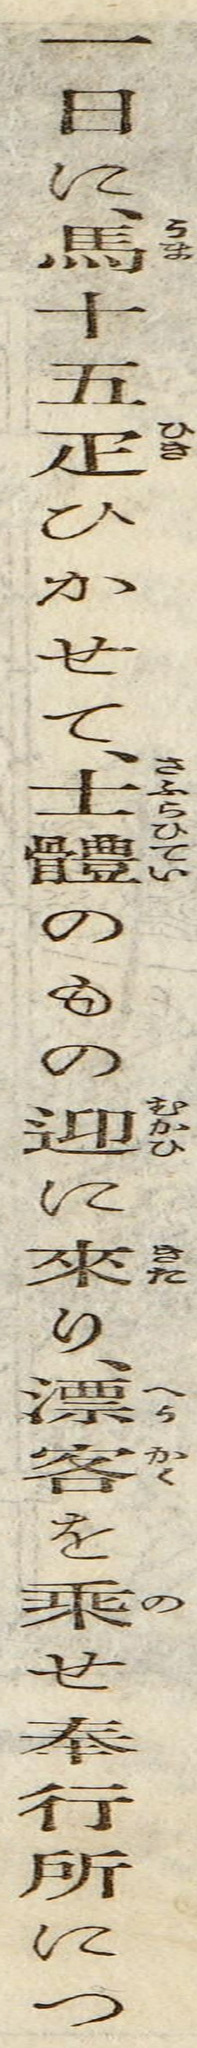一日に、馬十五疋ひかせて、士体のもの迎に来り、漂客を乗せ奉行所につ
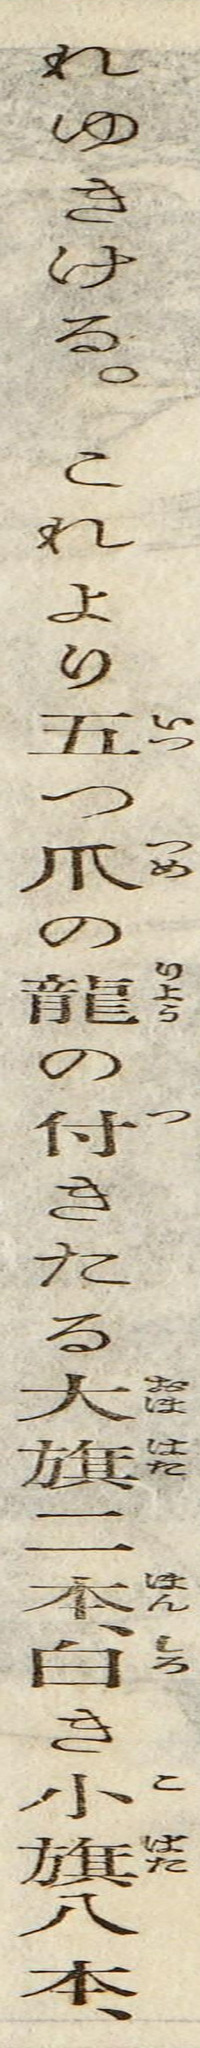れゆきける。これより五つ爪の竜の付きたる大旗二本、白き小旗八本、
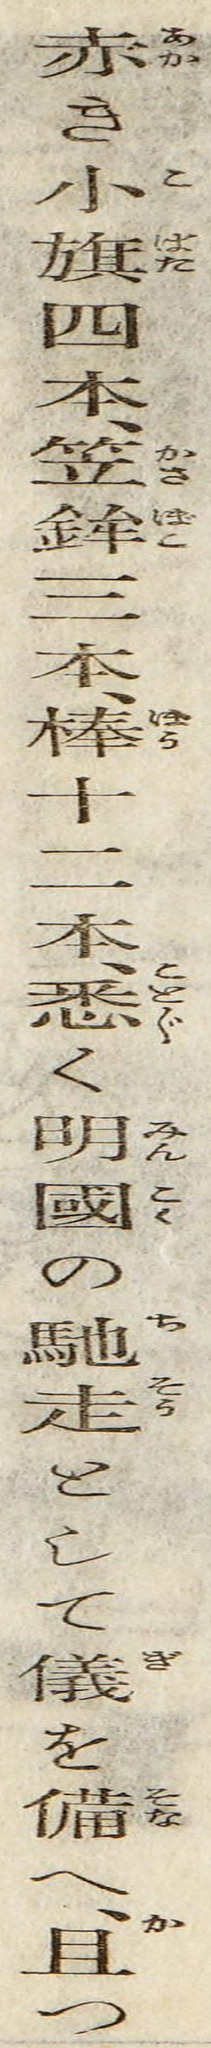赤き小旗四本、笠鉾三本、棒十二本、悉く明国の馳走として儀を備へ、且つ
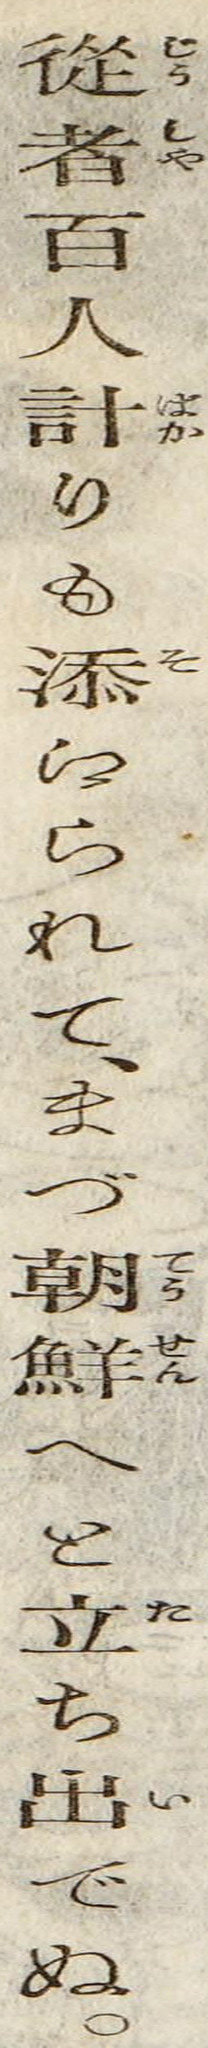従者百人計りも添えられて、まづ朝鮮へと立ち出でぬ。
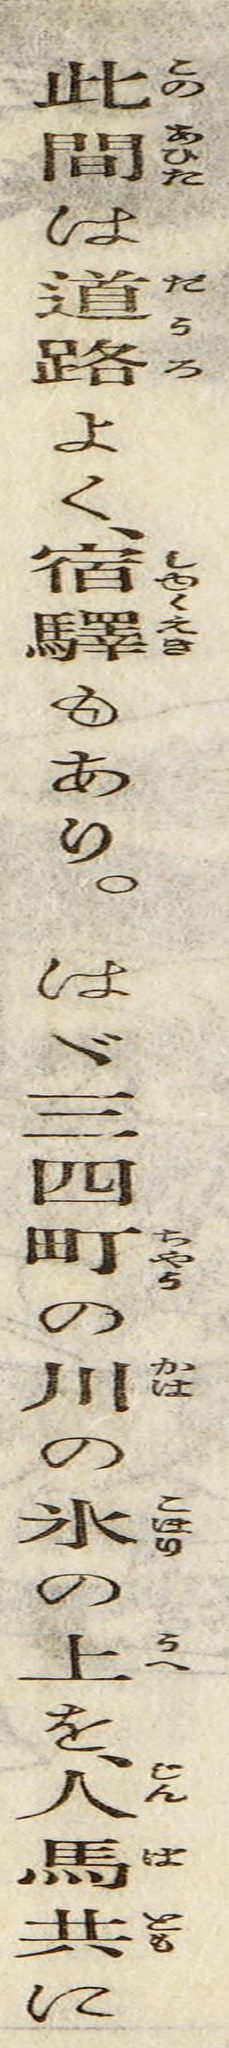此間は道路よく、宿駅もあり。はヾ三四町の川の氷の上を、人馬共に
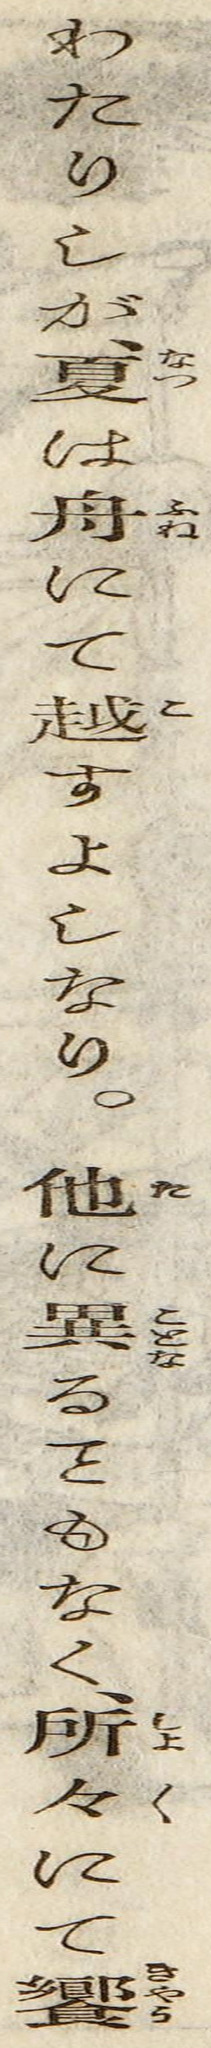わたりしが、夏は舟にて越すよしなり。他に異ることもなく、所々にて饗
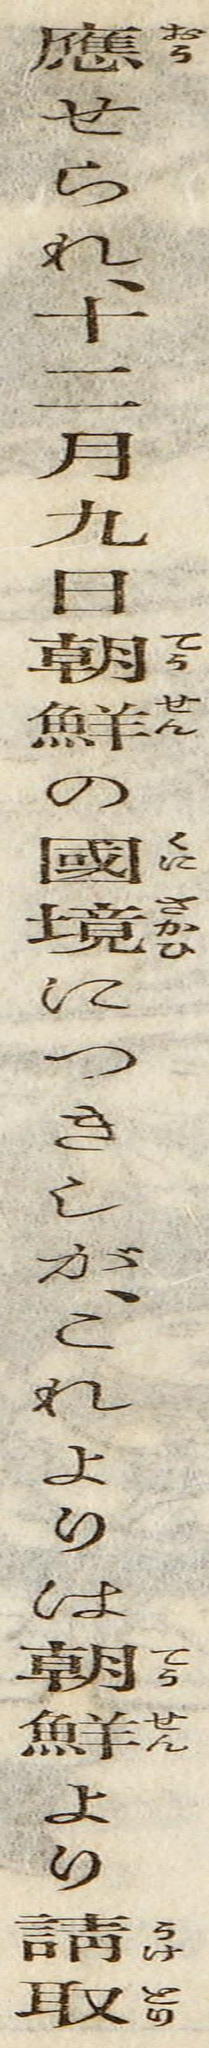応せられ、十二月九日朝鮮の国境につきしが、これよりは朝鮮より請取
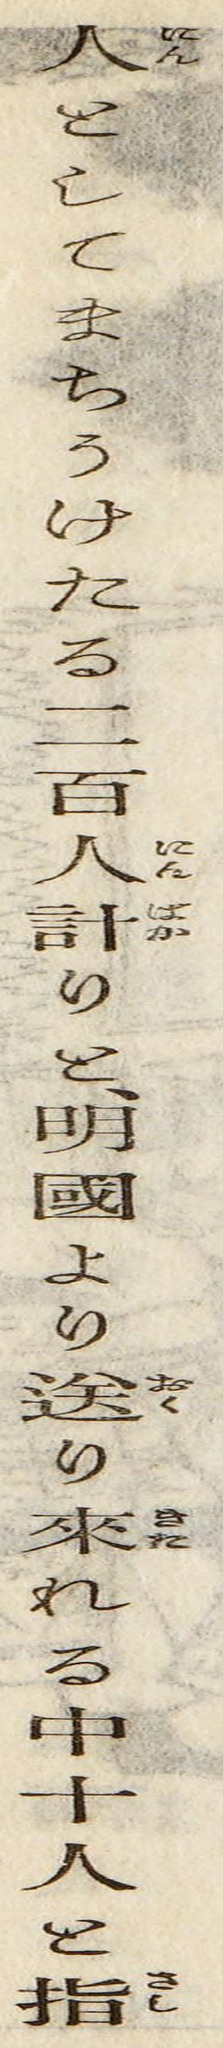人としてまちうけたる二百人計りと、明国より送り来れる中十人と指
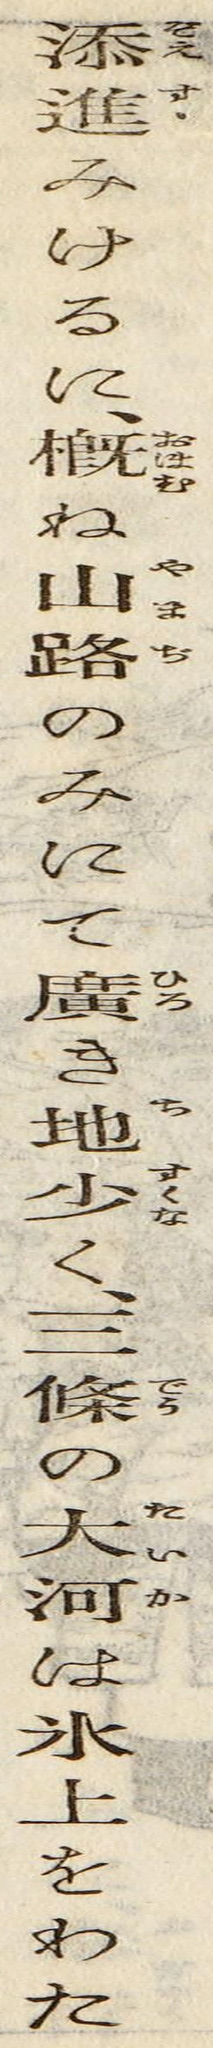添進みけるに、概ね山路のみにて広き地少く、三条の大河は氷上をわた
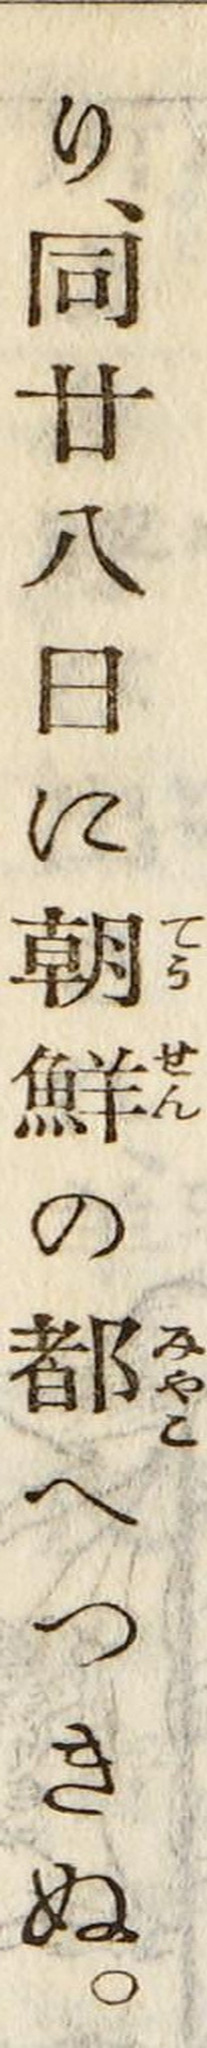り、同廿八日に朝鮮の都へつきぬ。
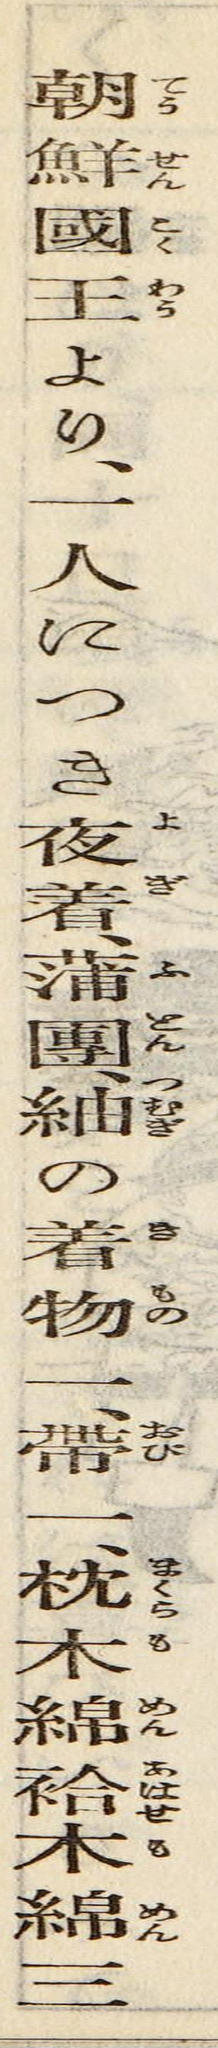朝鮮国王より、一人につき夜着、蒲団、紬の着物一、帯一、枕木綿袷木綿三
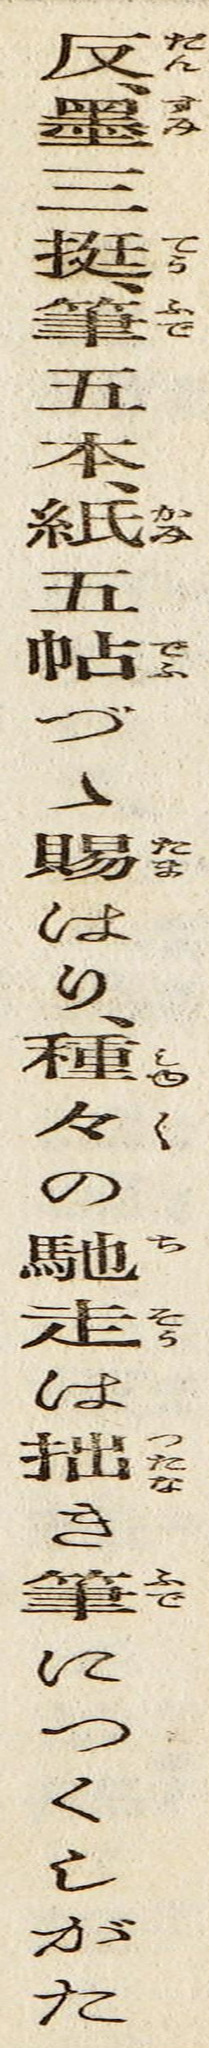反、墨三挺、筆五本、紙五帖づゝ賜はり、種々の馳走は拙き筆につくしがた
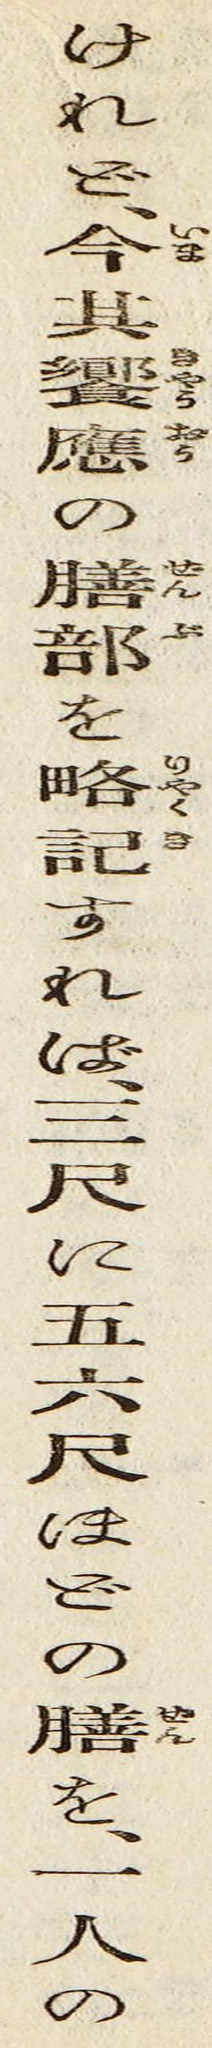けれど、今其饗応の膳部を略記すれば、三尺に五六尺ほどの膳を、一人の
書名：日本漂流譚
